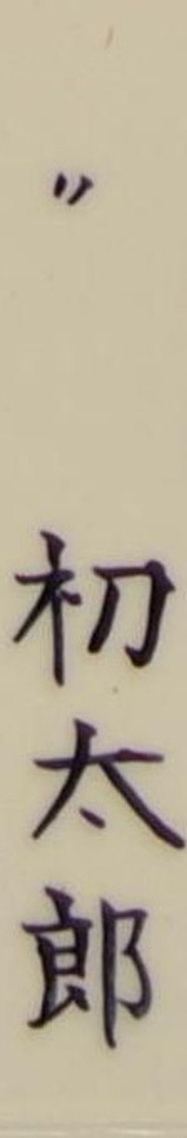初太郎
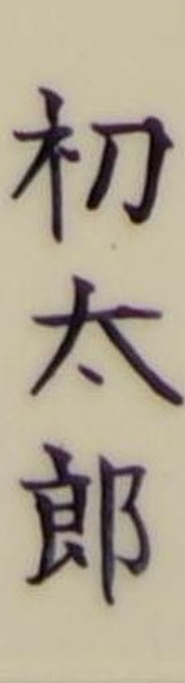初太郎
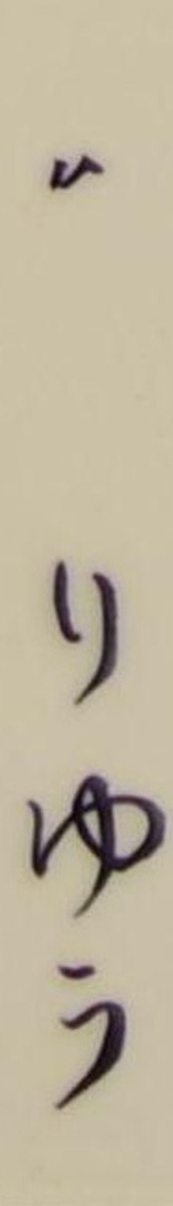りゆう
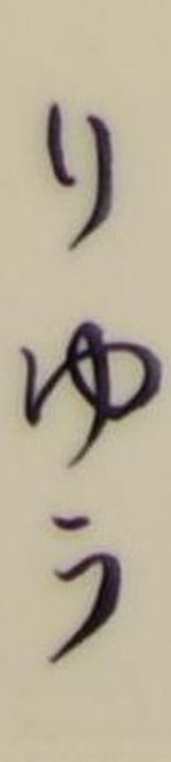りゆう
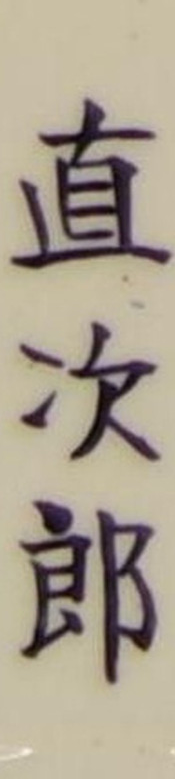直次郎
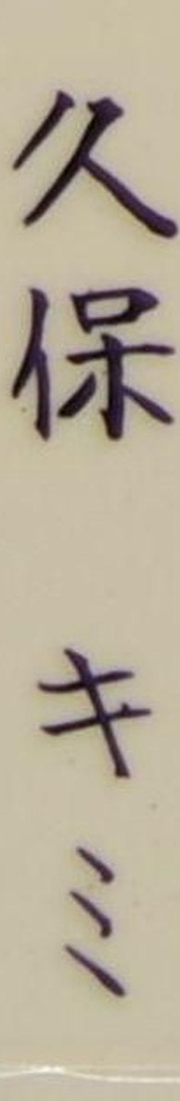久保キミ

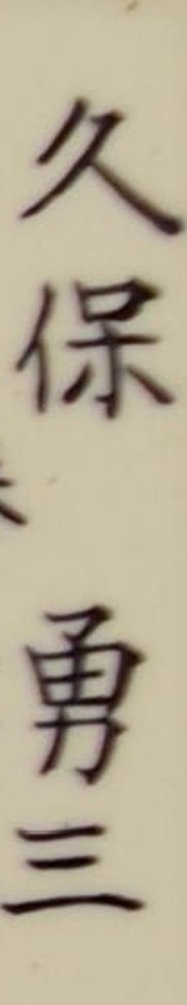久保勇三
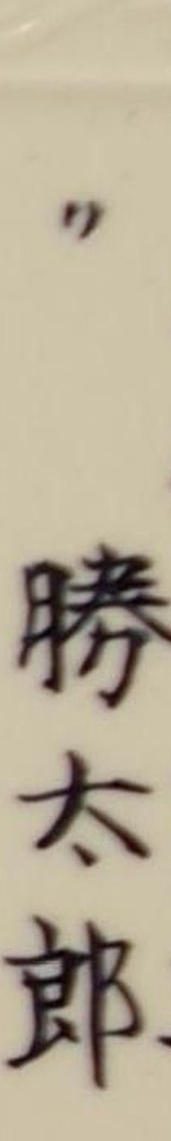勝太郎
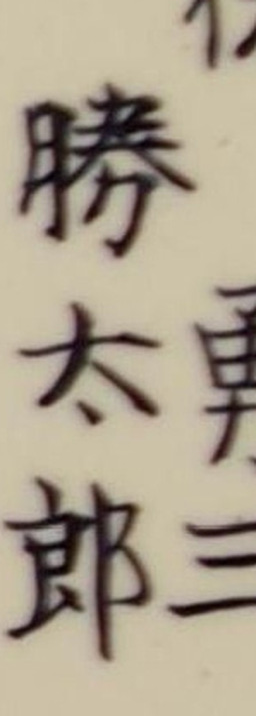勝太郎
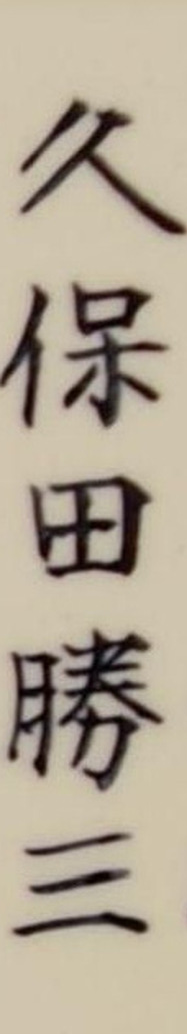久保田勝三
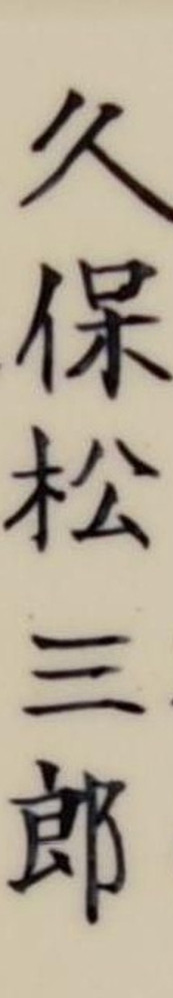久保松三郎
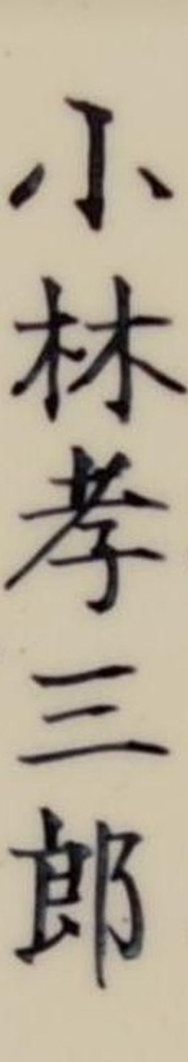小林孝三郎
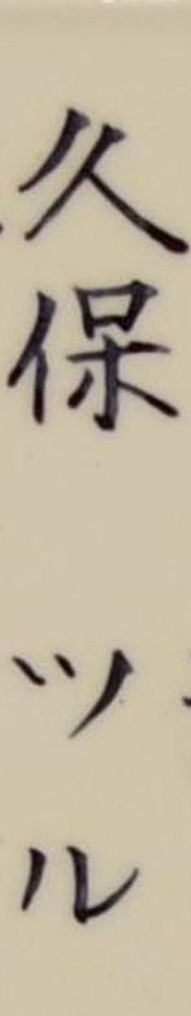久保ツル
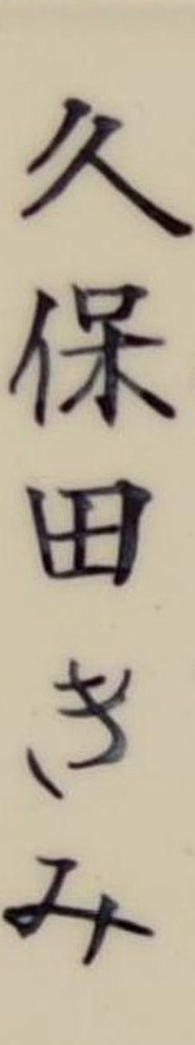久保田きみ
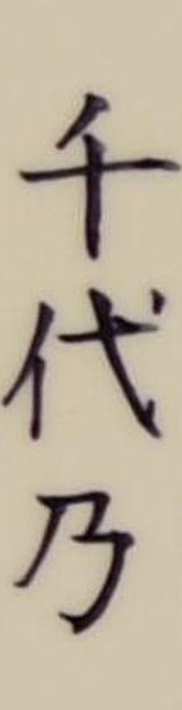千代乃

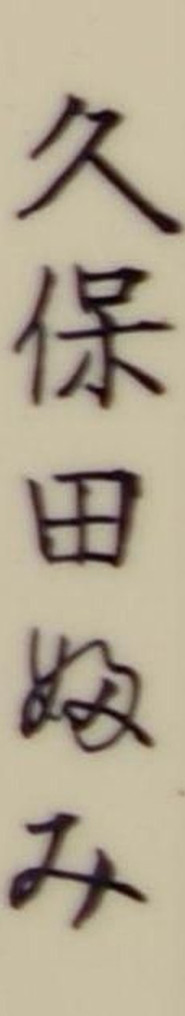久保田ふみ
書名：A~D
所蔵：koyasan kongobuji
